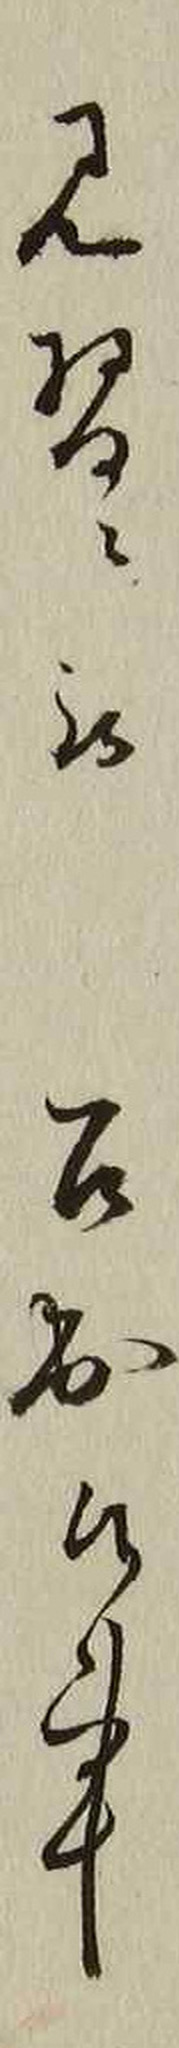見習ニ被召出候事
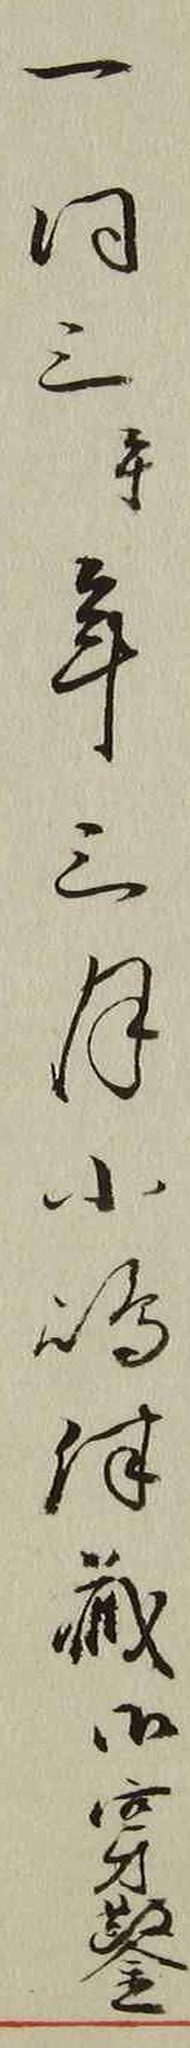一同三午年三月小嶋伴蔵御穿鑿
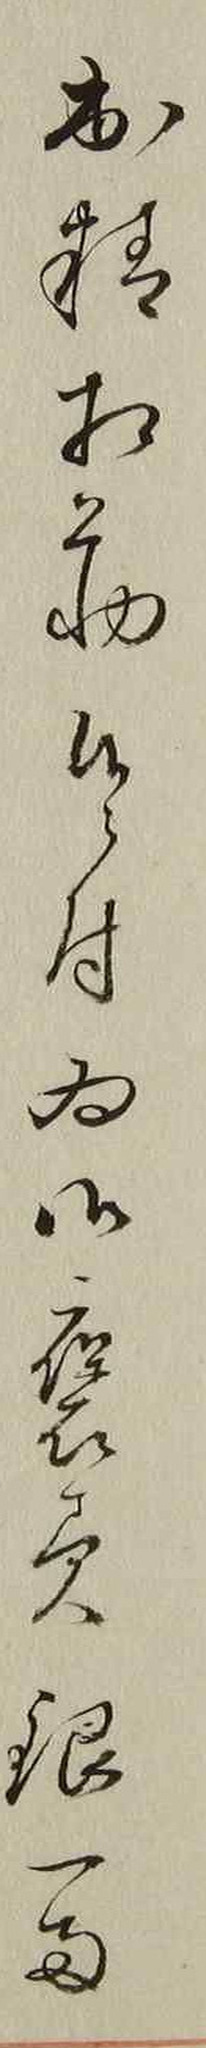出精相勤候ニ付為御褒美銀一両
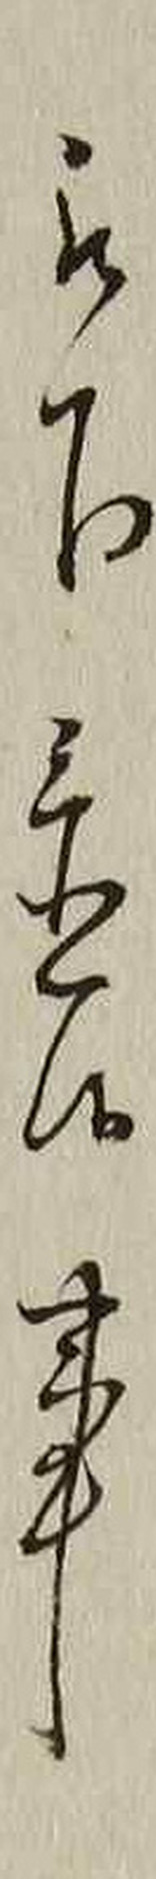被下置候事
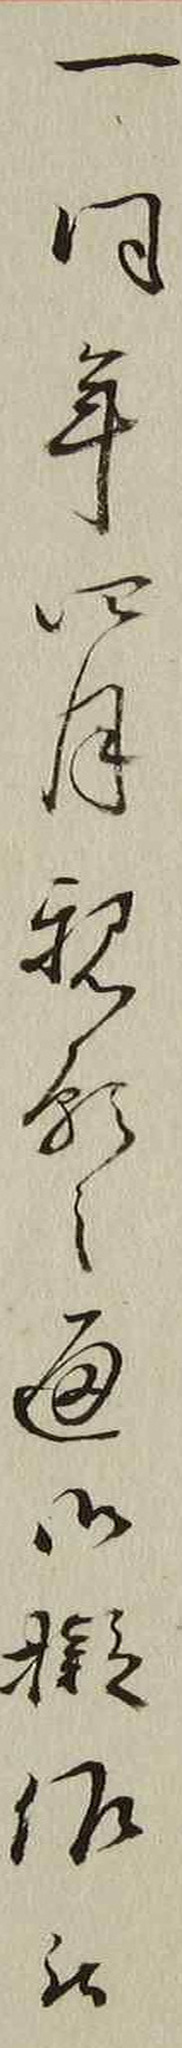一同年四月親願之通御擬作被
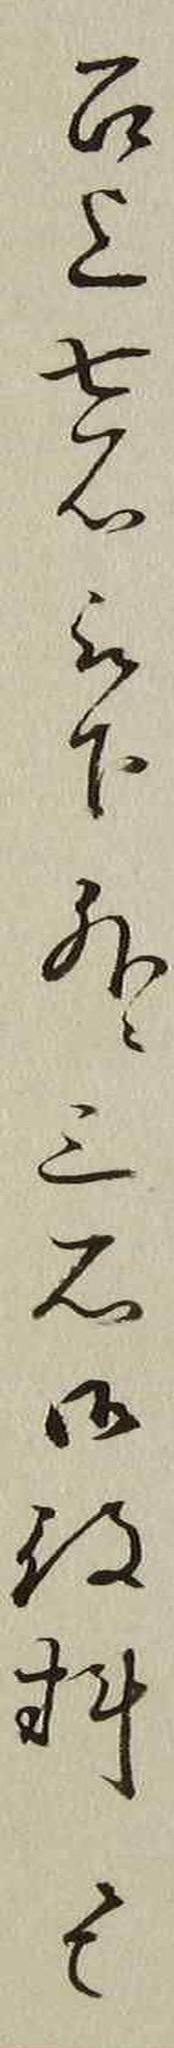召上七石被下外ニ三石御役料ニて
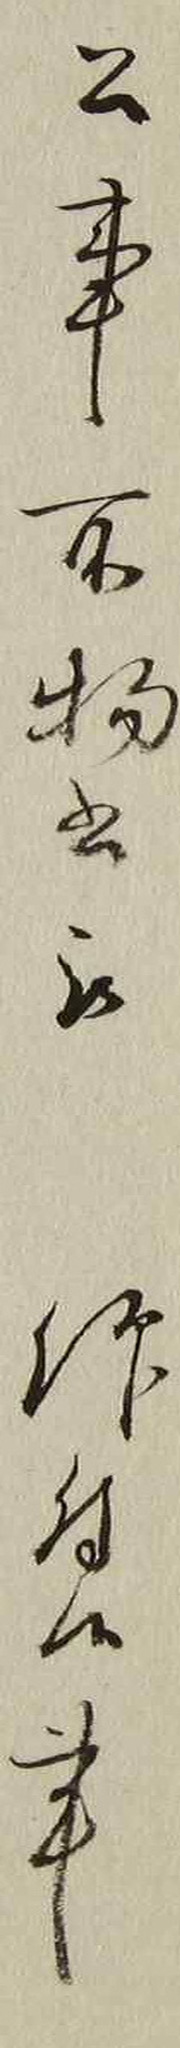公事所物書被仰付候事
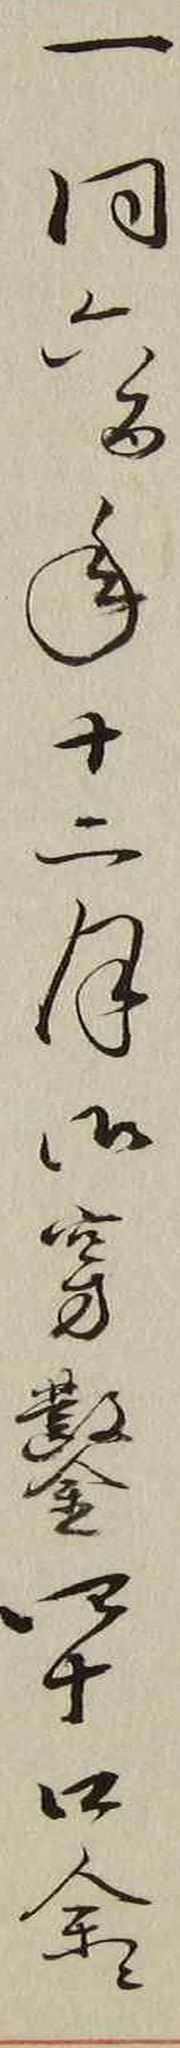一同六酉年十二月御穿鑿四十口余ニ
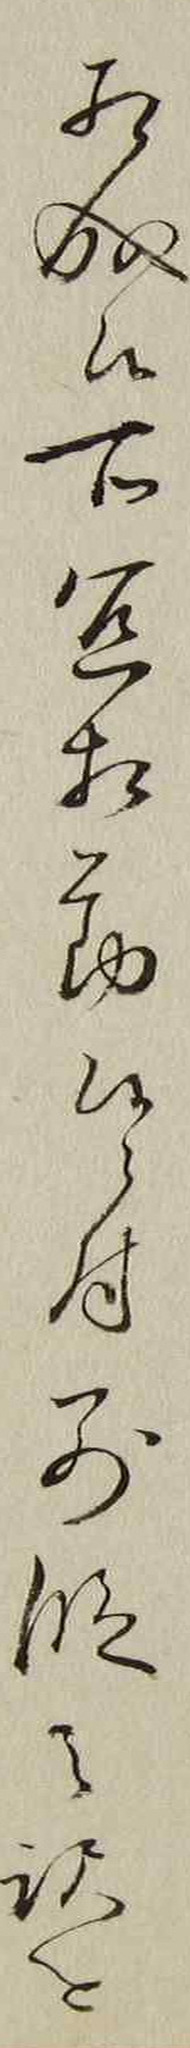相成候所宜相勤候ニ付別段之訳を
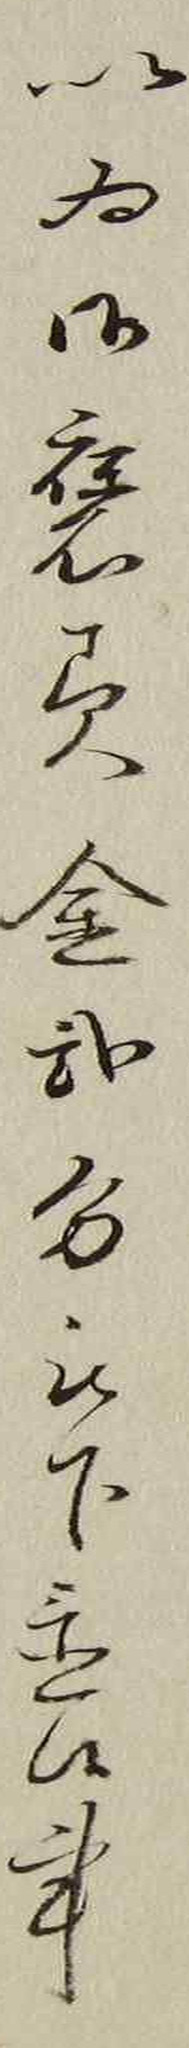以為御褒美金弐分被下置候事
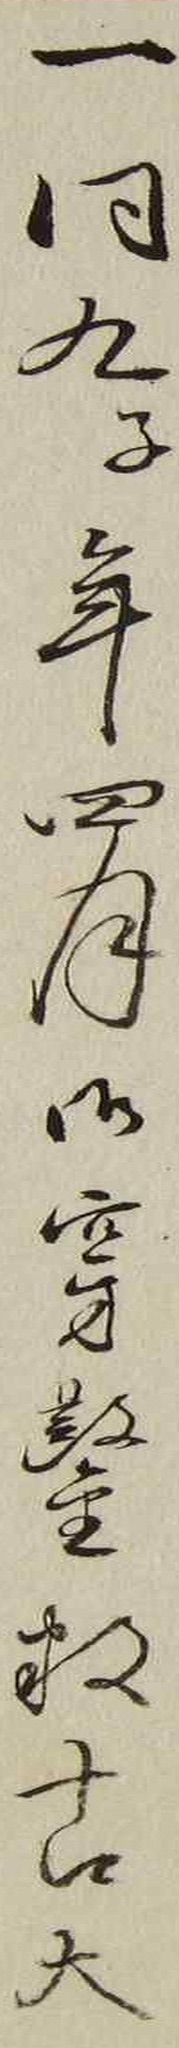一同九子年四月御穿鑿数十口大
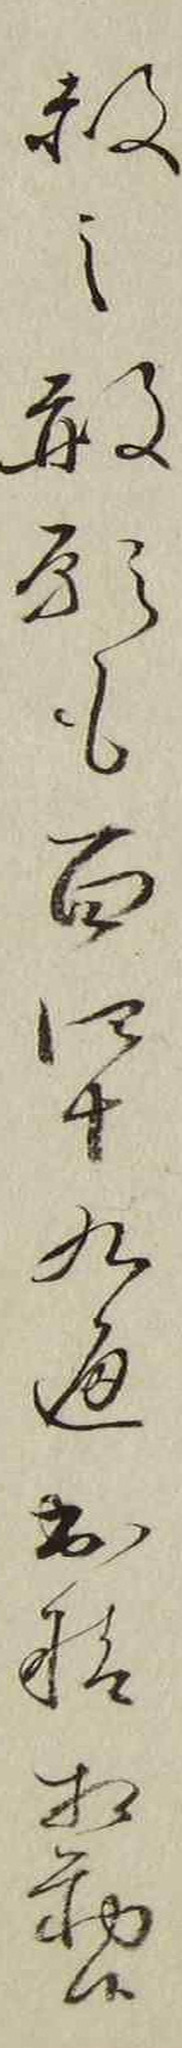赦之赦願も百四十九通出精相勤候

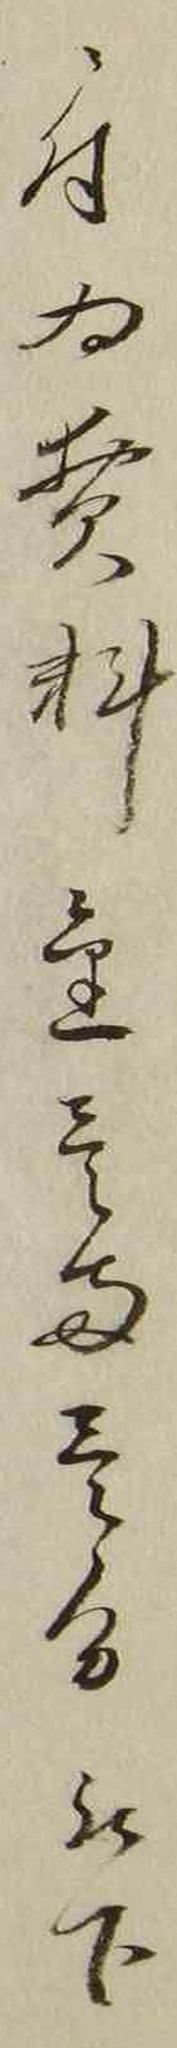ニ付為費料金壱両壱分被下
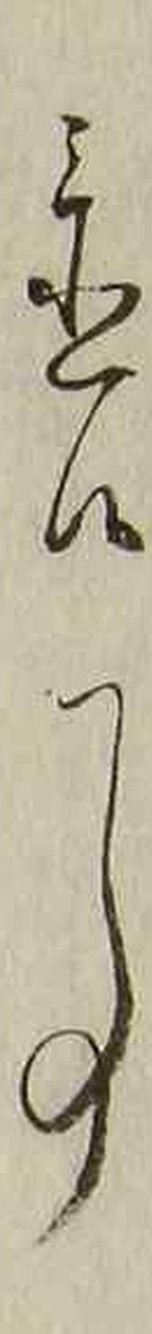置候事
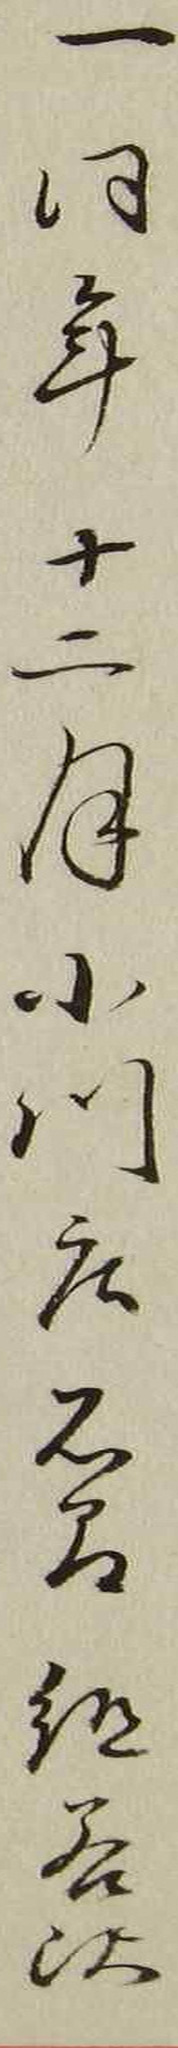一同年十二月小川庄石間組谷沢
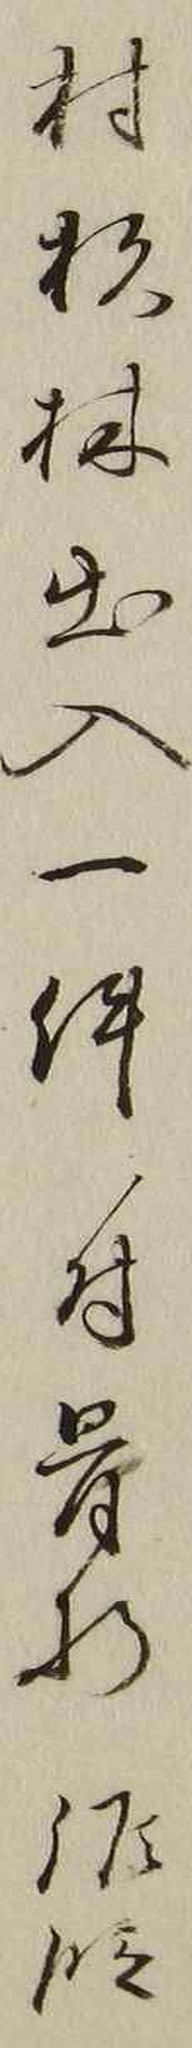村杉林出入一件ニ付骨折候段
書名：諸士系譜　巻之8　い之部8
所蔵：会津若松市立会津図書館
